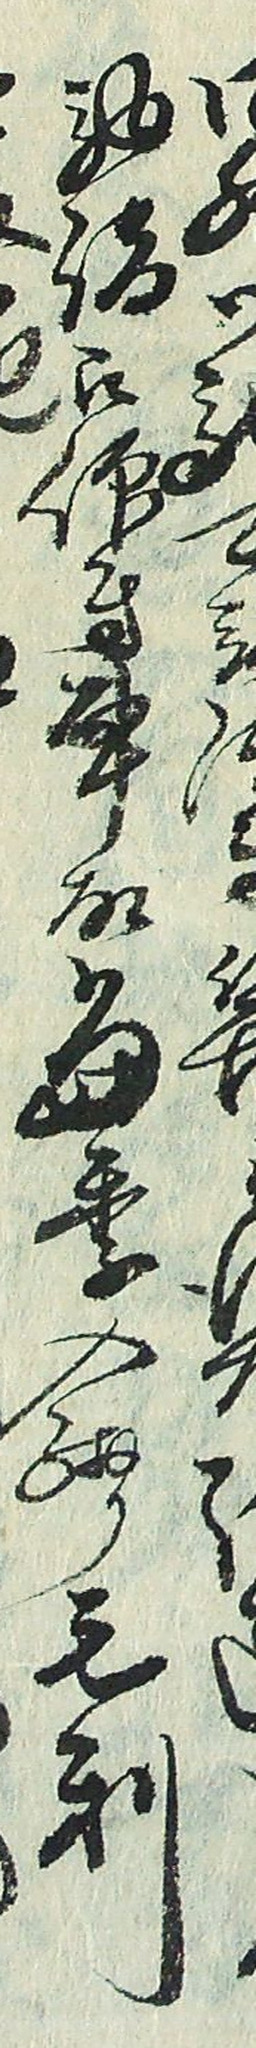拝借被仰付事故當季入残り元利
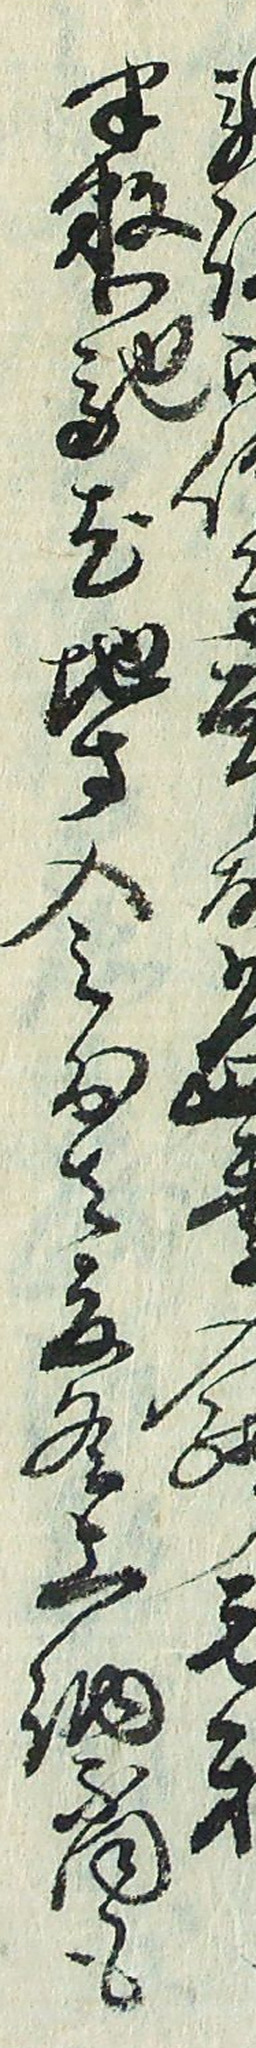半数御馳尤地方入之分者夏冬上納不同も

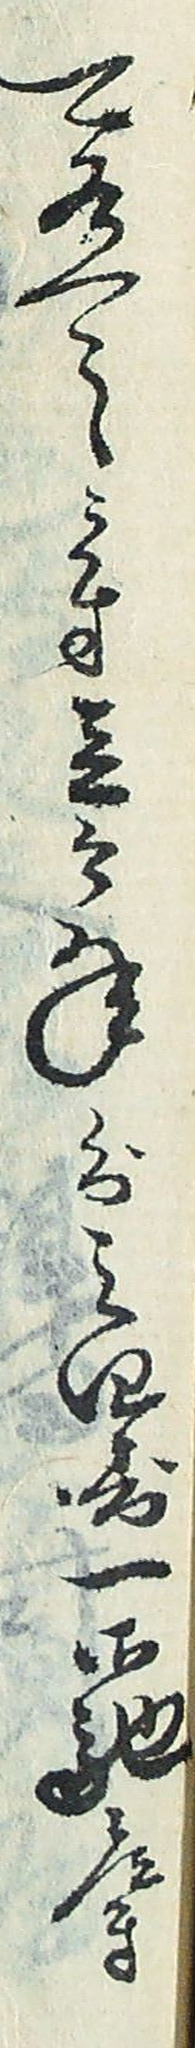可有之ニ付壱ケ年分之四歩一御馳被仰付
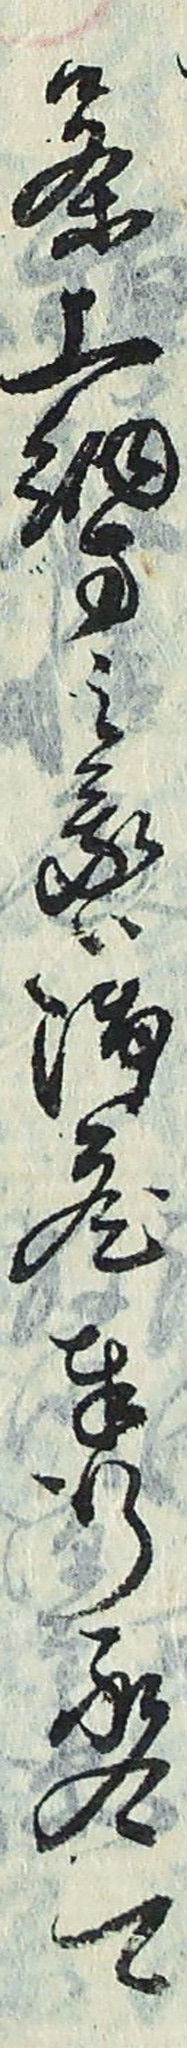候条上納方之義ハ御蔵奉行承合可
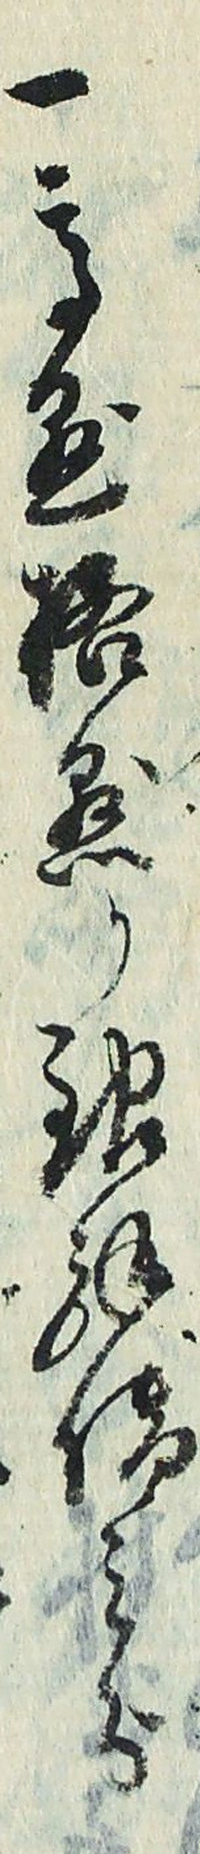一高懸格懸り銀拝借之分
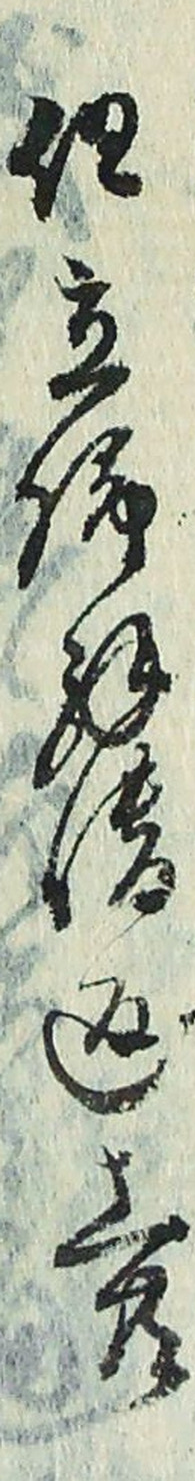但立帰拝借返上共
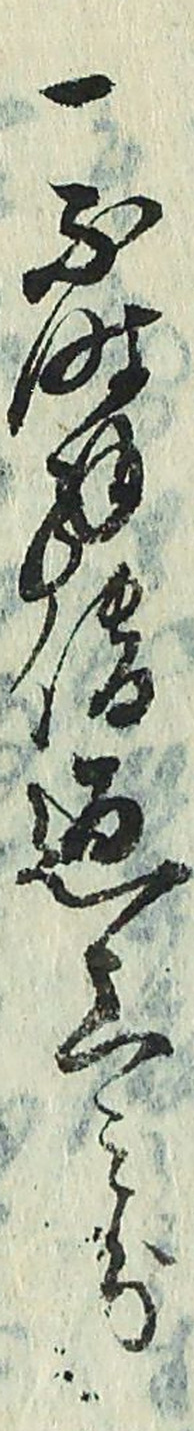一不時拝借返上之分
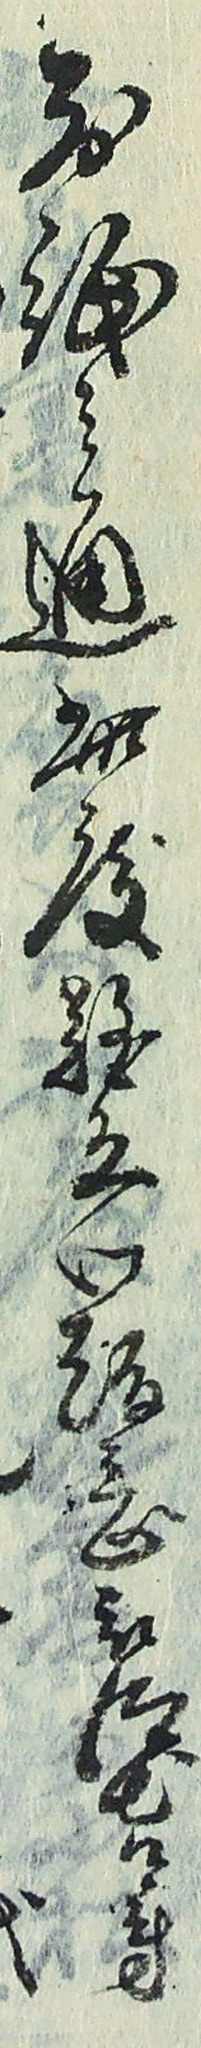別紙之通此度難有御趣意被仰出候ニ付
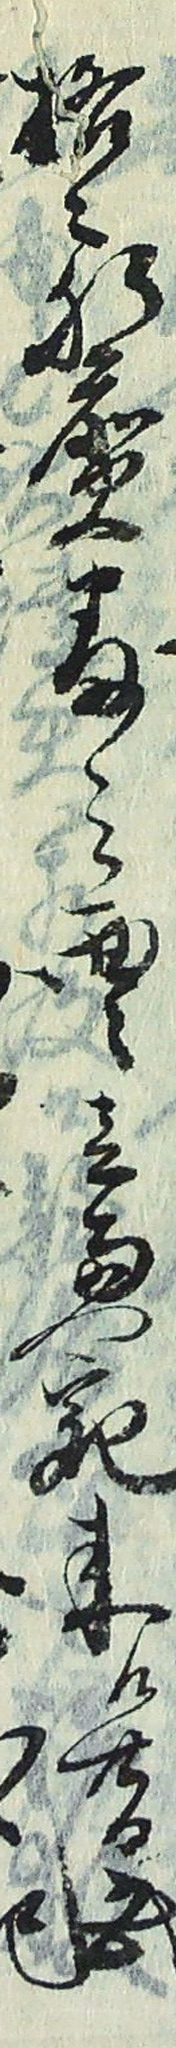格々肝煎番之面々壱両人宛来ル廿日當
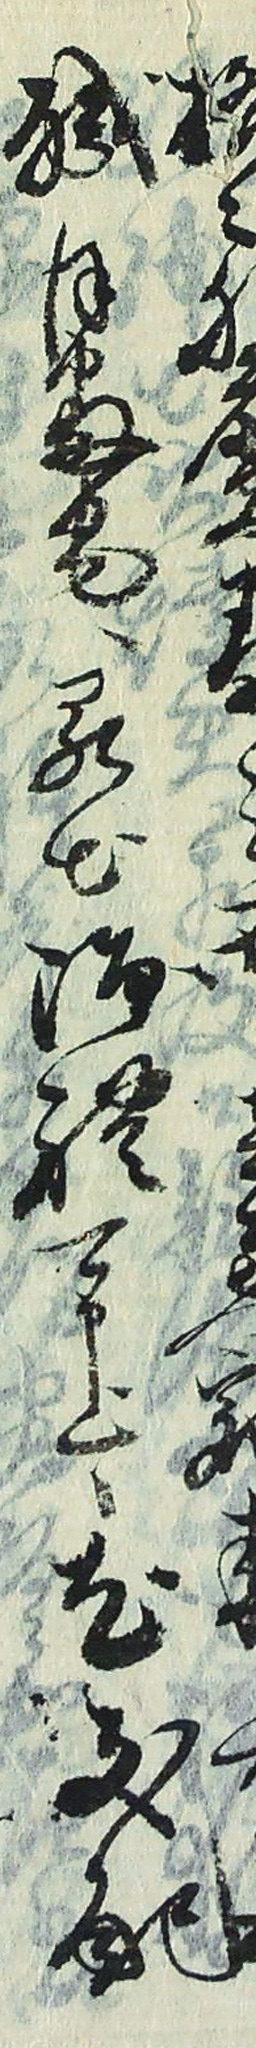職月番宅へ罷出御禮可申上候尤支配
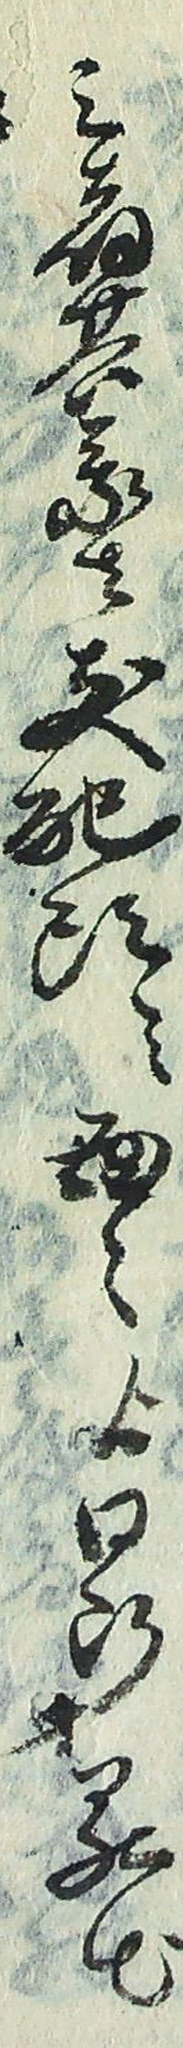之者共義者支配頭之面々ゟ同断罷出
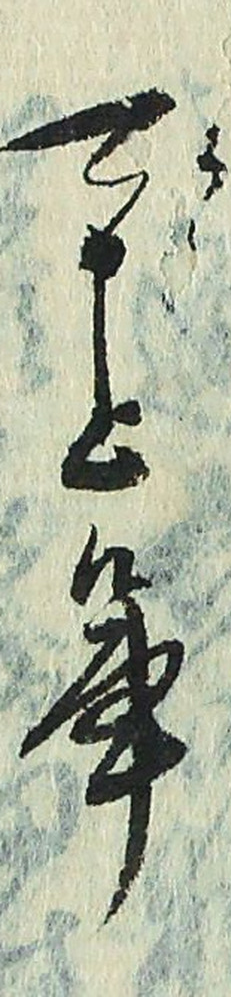可申上候事

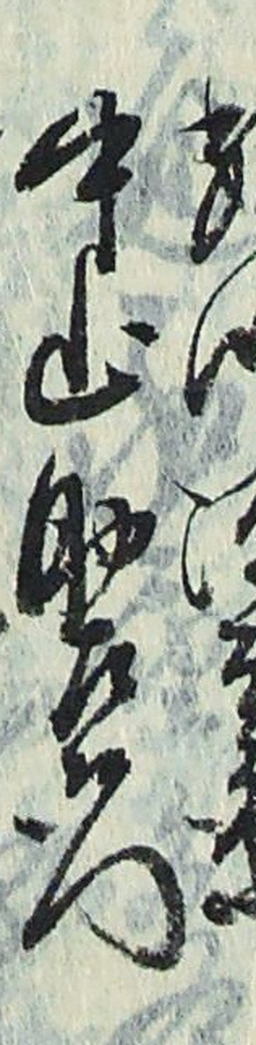○中山助左衛門
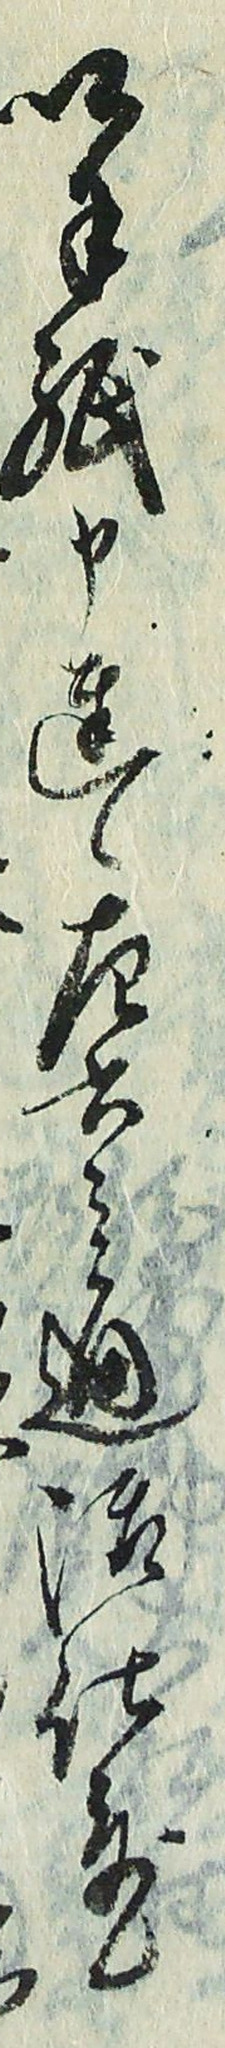以手紙申達候左書之通御仕置
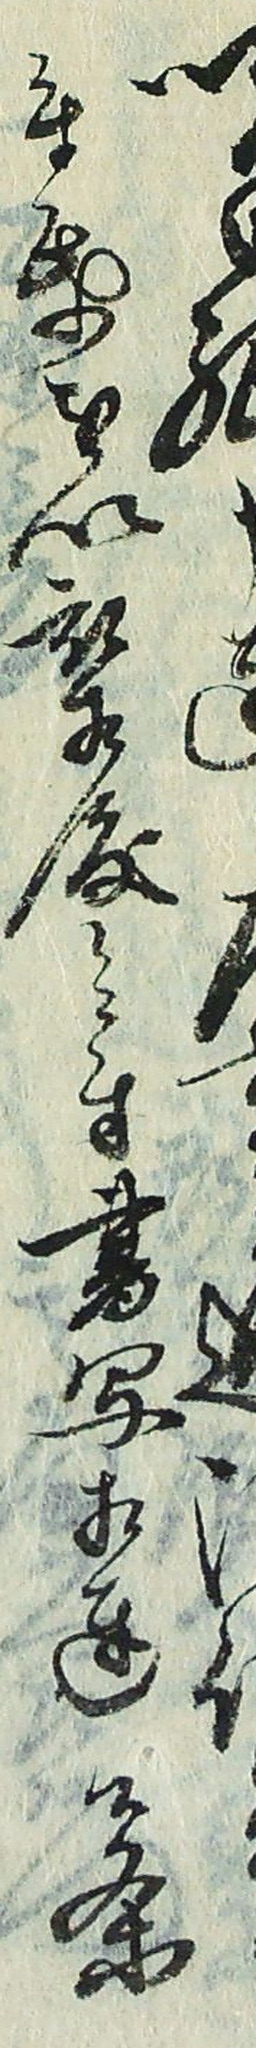付帋を以被相渡候ニ付書写相達候条
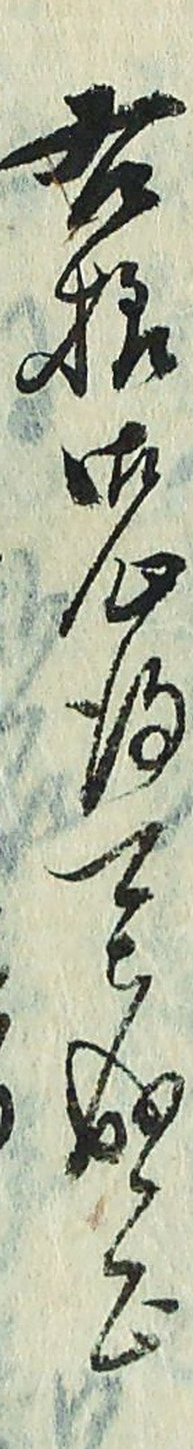右様御心得可被成候以上
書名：諸御趣意書并御下知向之写
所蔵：鳴門教育大学 Naruto University of Education
